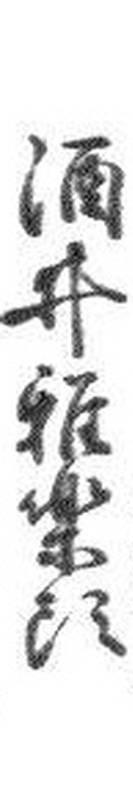酒井雅樂頭
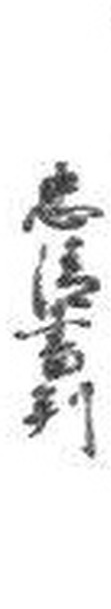忠清書判
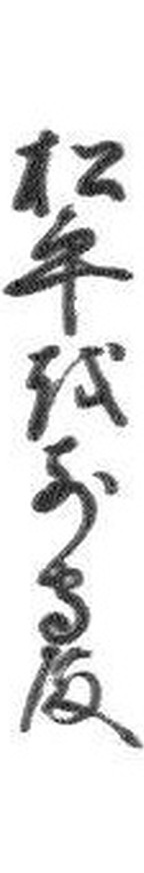松平越前守殿
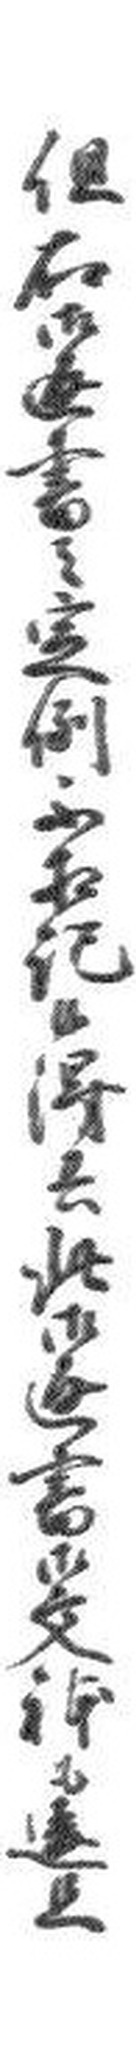但右御返書之定例不相記候得共此御返書御文体も違且

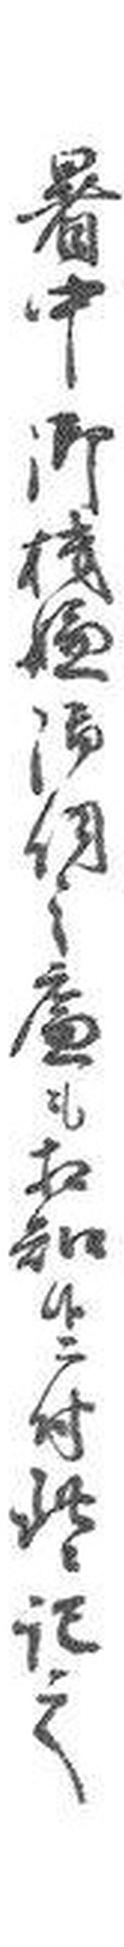暑中御機嫌御伺之廉も相知候ニ付此ニ記之
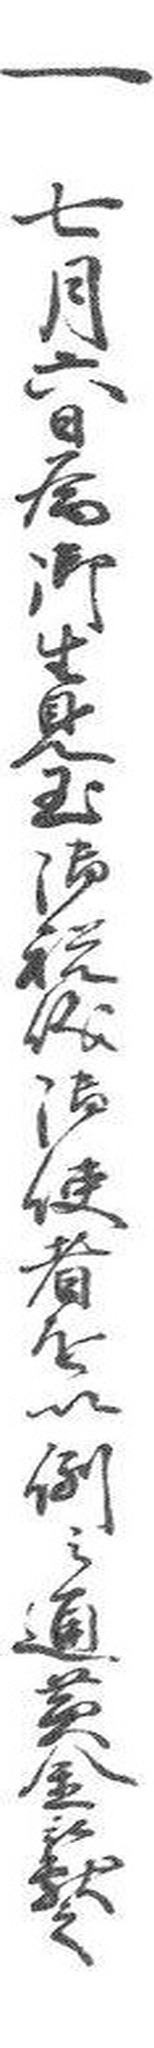一七月六日為御生見玉御祝儀御使者を以例之通黄金被献之
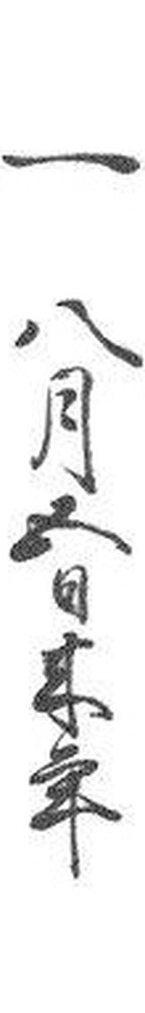一八月五日来年
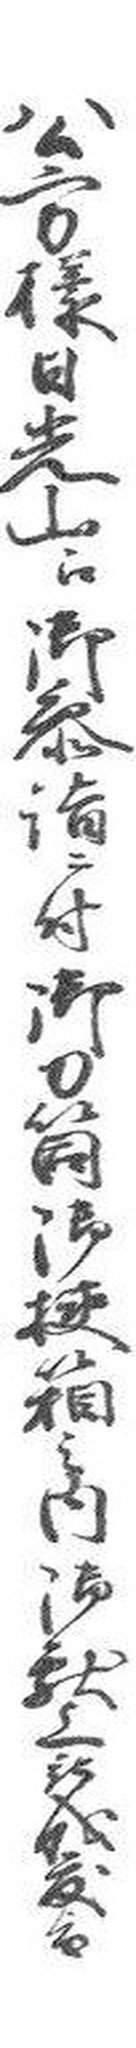公方様日光山江御参詣ニ付御刀筒御挟箱之内御献上被成度旨
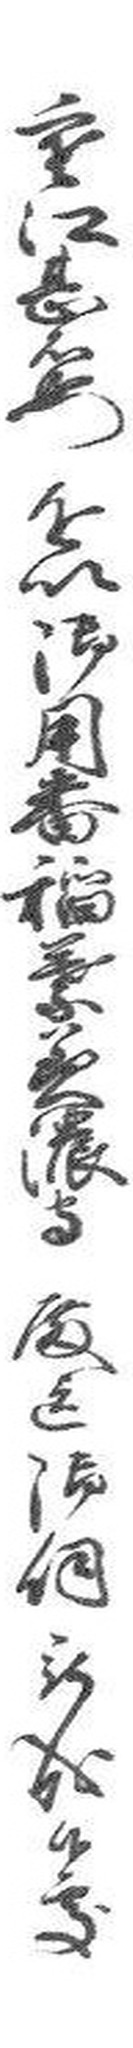寒江甚右衛門を以御用番稲葉美濃守殿迄御伺被成候処
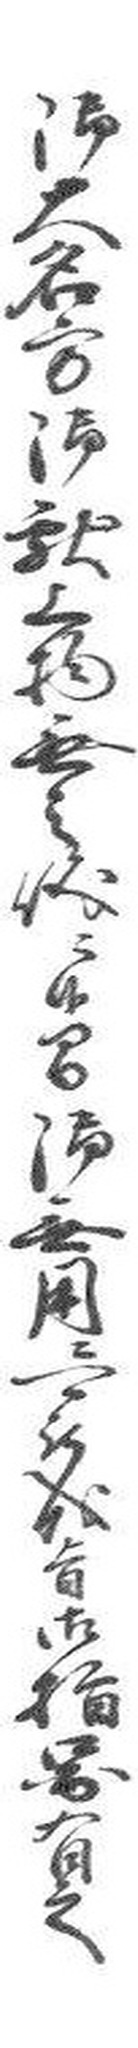御大名方御献上物無之儀ニ候間御無用ニ可被成旨御指図有之
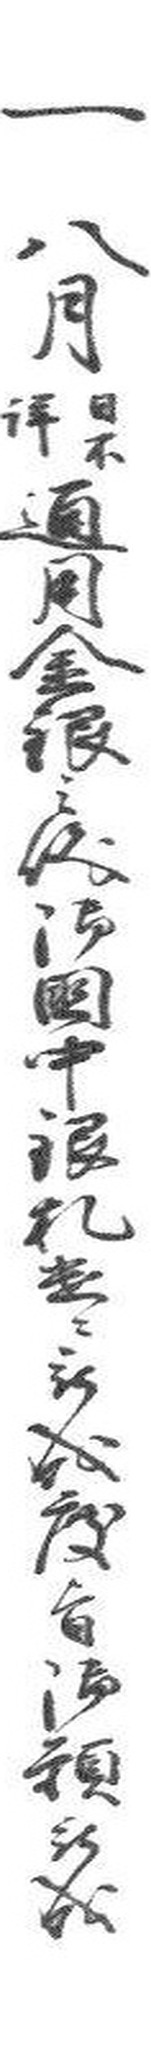一八月日不詳通用金銀之儀御国中銀札遣ニ被成度旨御願被成
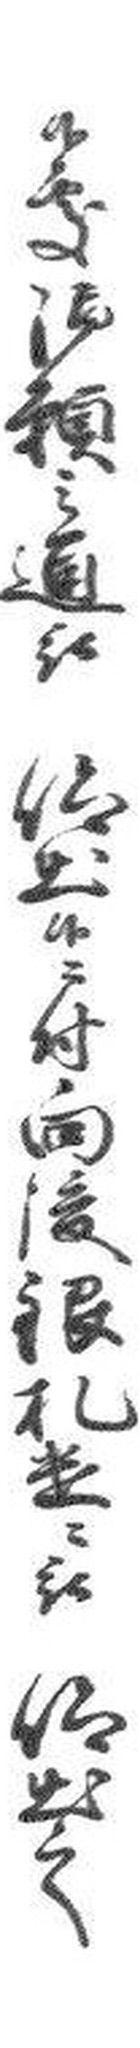候処御願之通被仰出候ニ付向後銀札遣ニ被仰出之
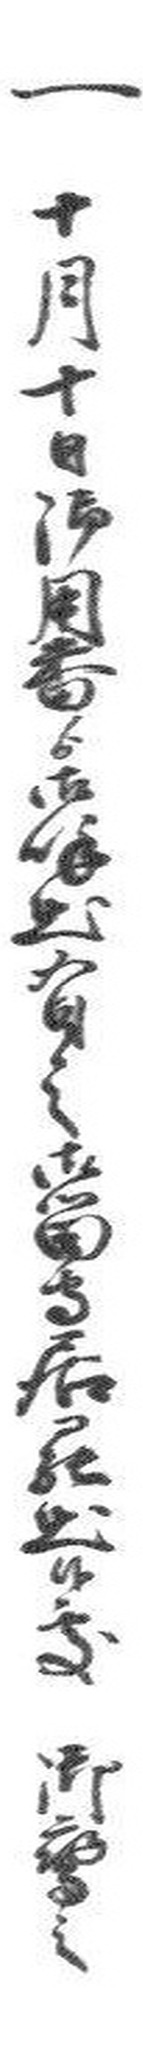一十月十日御用番ゟ御呼出有之御留守居罷出候処御鷹之
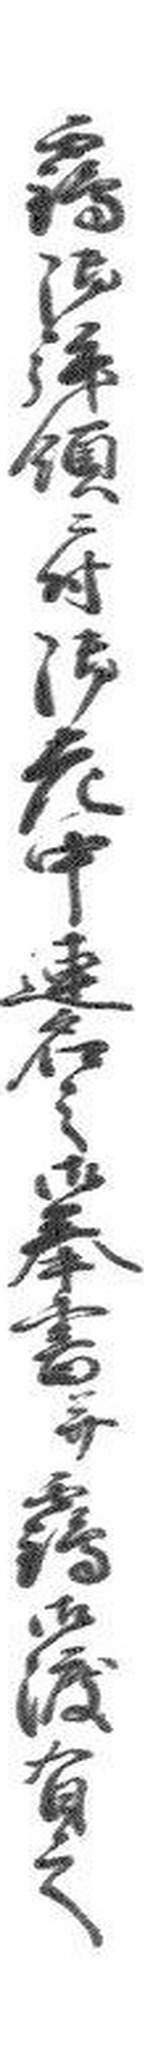鶴御拝領ニ付御老中連名之御奉書并鶴御渡有之
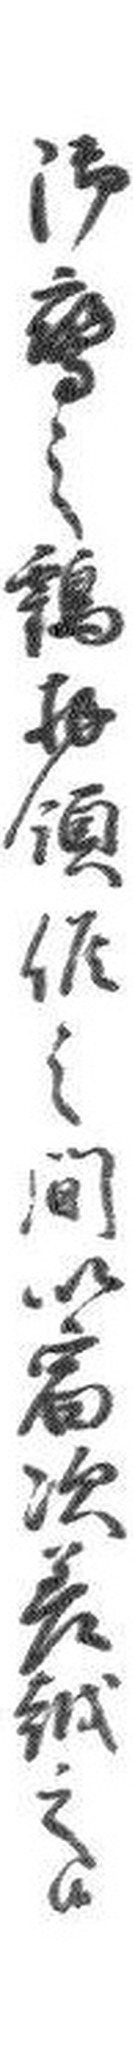御鷹之鶴拝領候之間以宿次差越之候
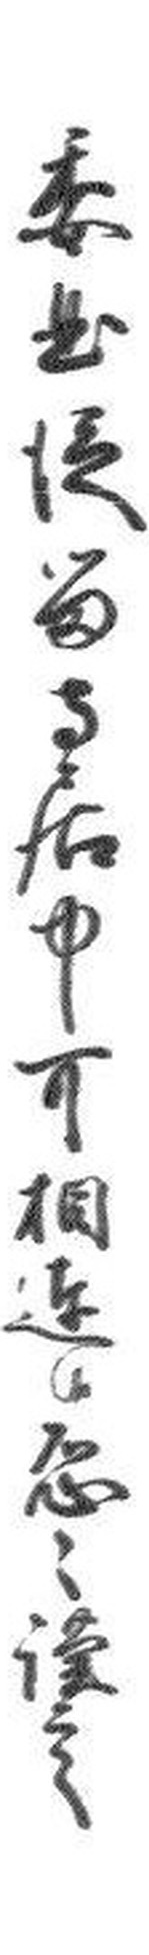委曲従留守居中可相達候恐々謹言
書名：家譜 六 光通公 従万治三年到寛文三年
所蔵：福井県文書館 Fukui Prefectural Archives
